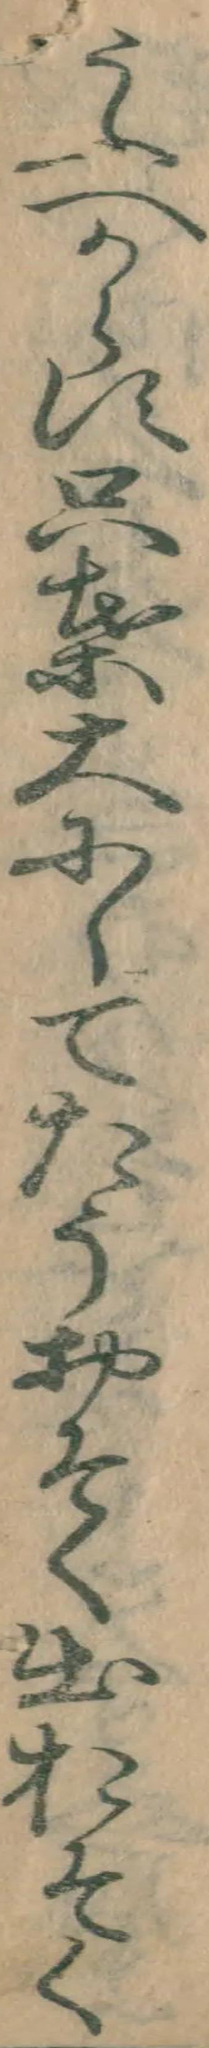うふへからす只葉大にしてたうおそく出おそく

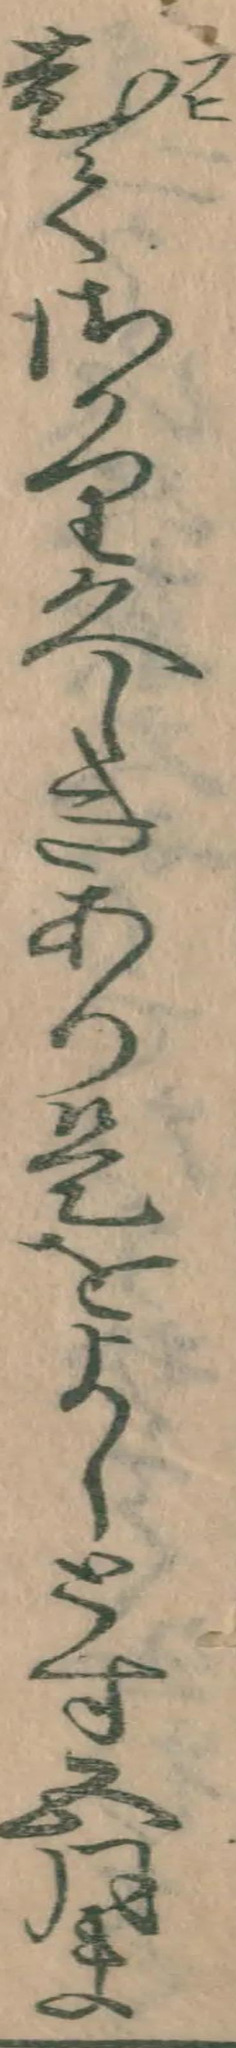老てさかり久しきあり是をよしとす五月ま
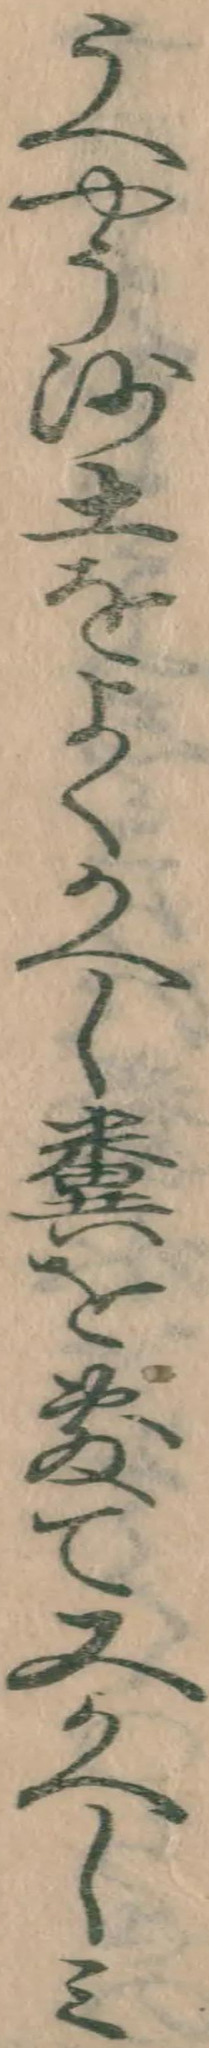うへやう沙土をよくかへし糞を敷て又かへしみ
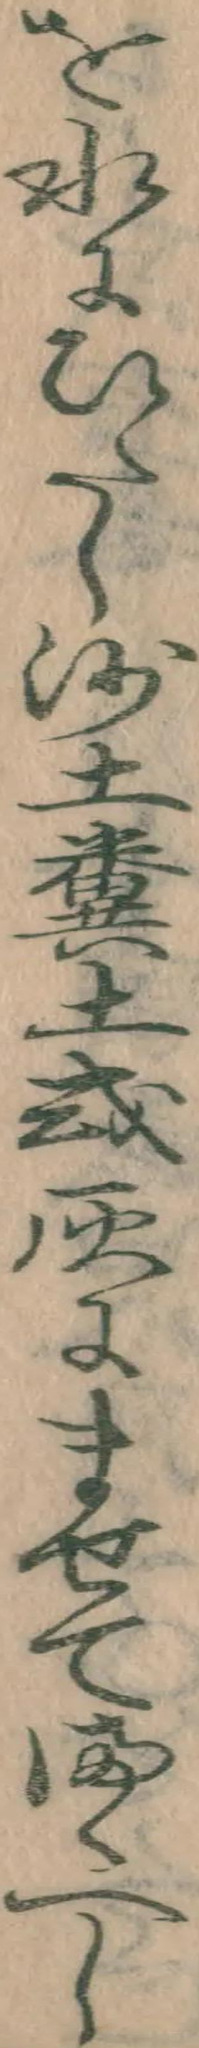を水にひたし沙土糞土或灰にませてまくへし
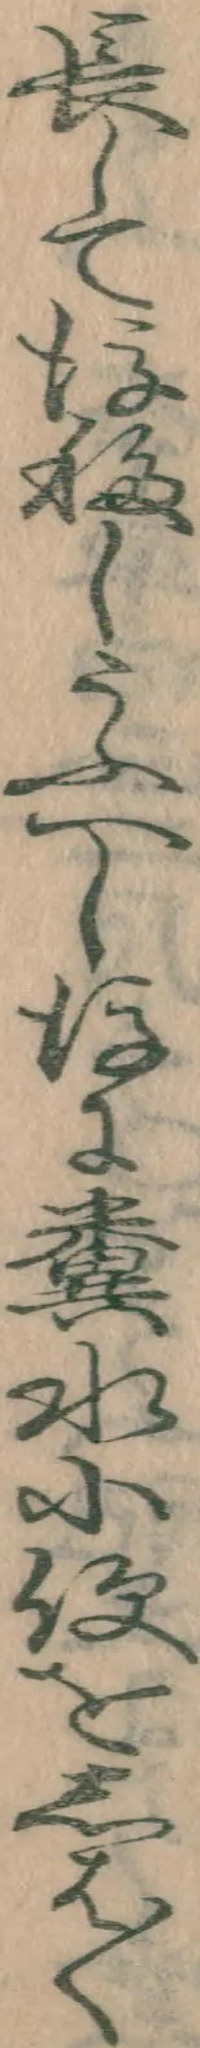長して後移しうふへし後に糞水小便をしは〳〵
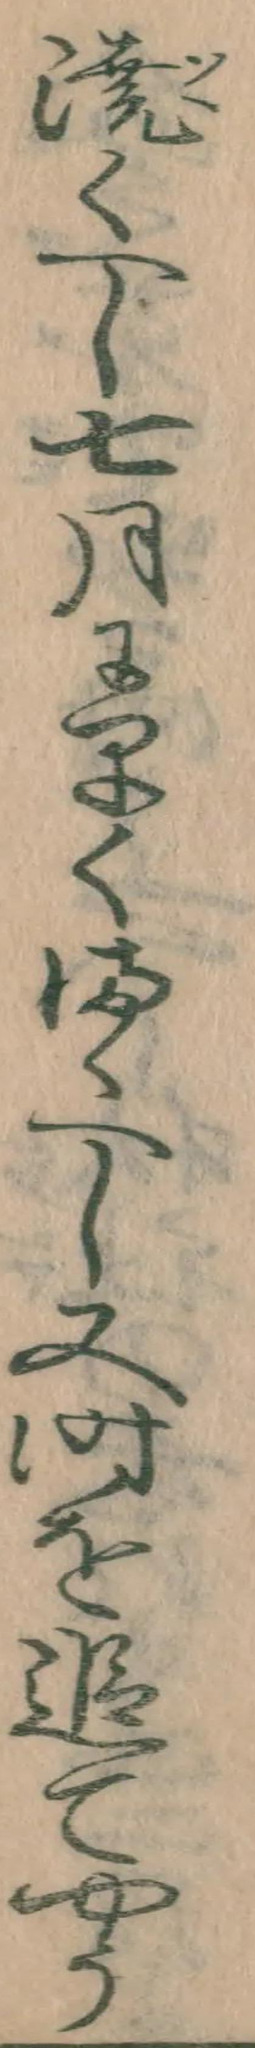澆くへし七月に早くまくへし又時を追てやう
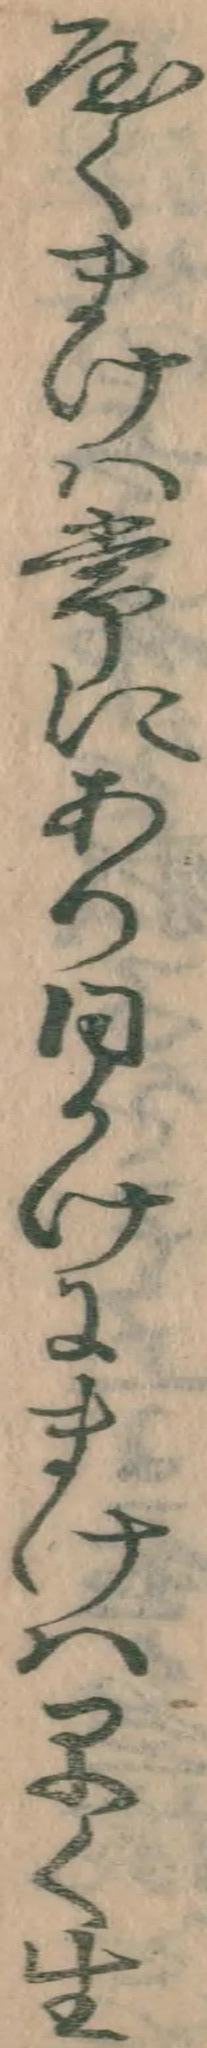やくまけは常にあり日かけにまけは早く生
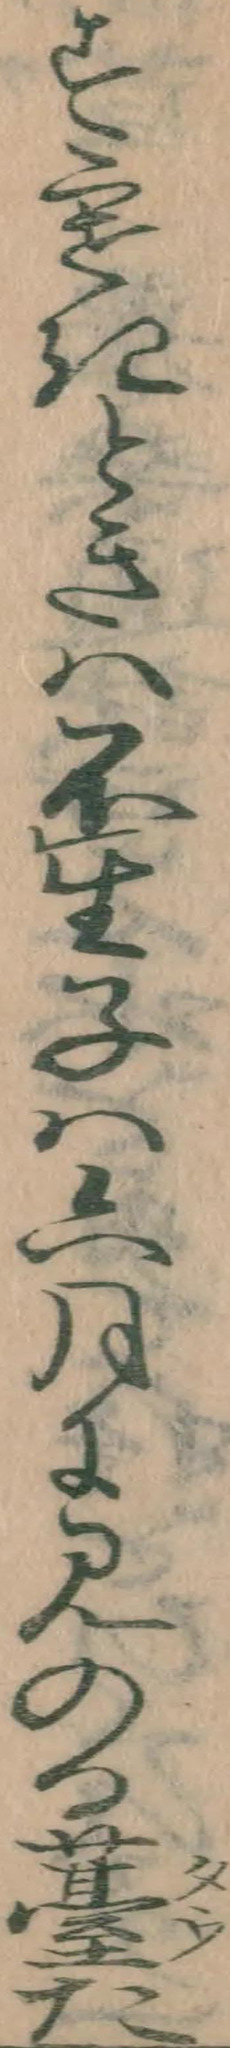す寒きときは不生子は六月にみのる薹た
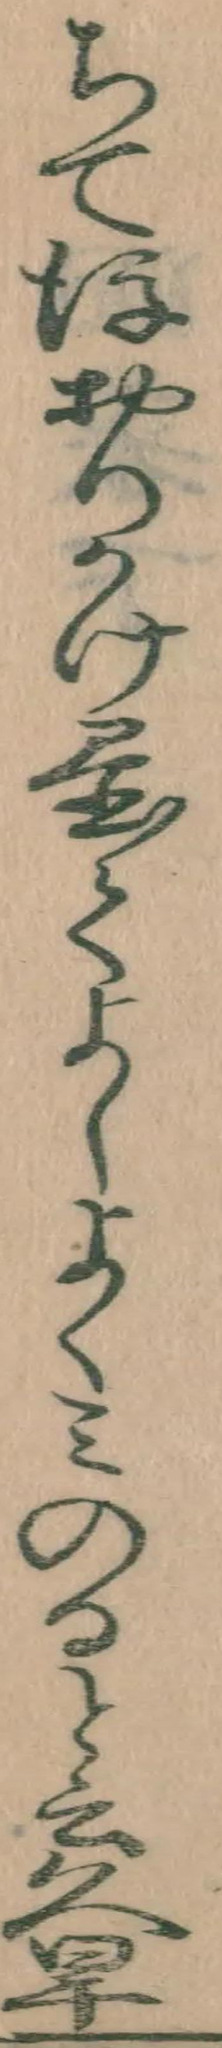ちて後おりかけ置てよしよくみのると云久旱
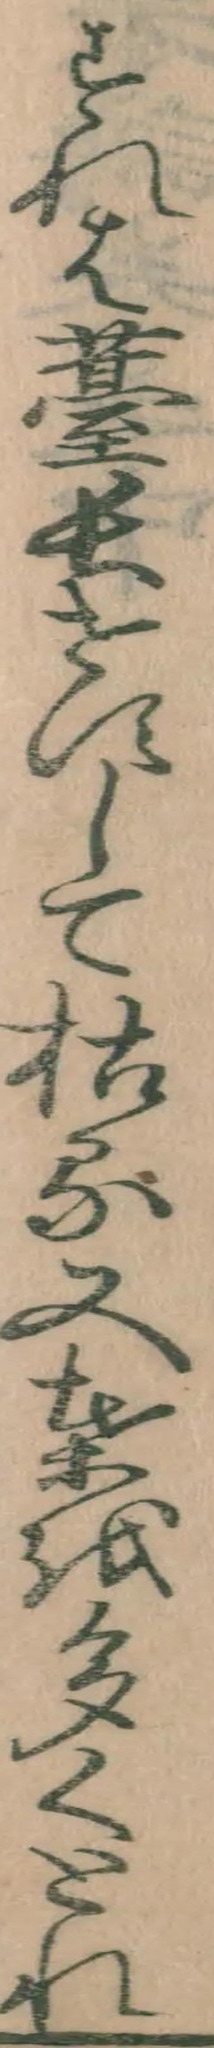すれは薹長せすして枯る又葉を多くとれ
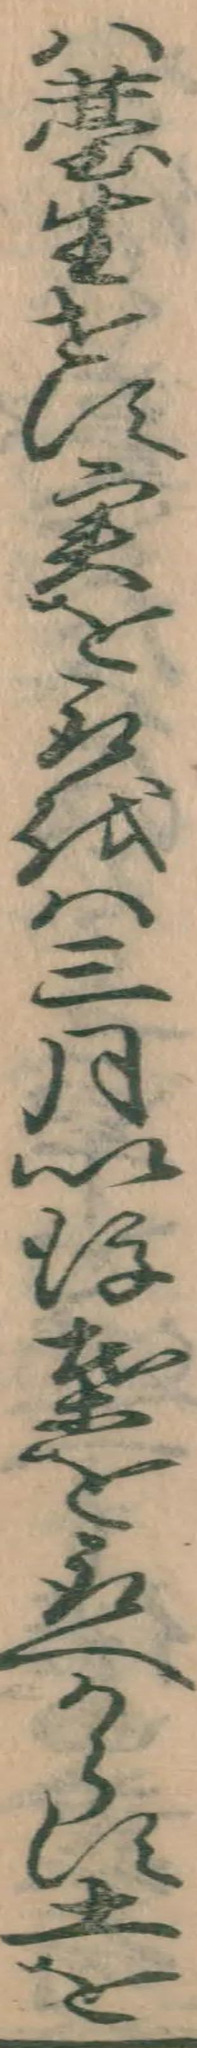は薹生せす実を取をは三月以後葉を取へからす土を
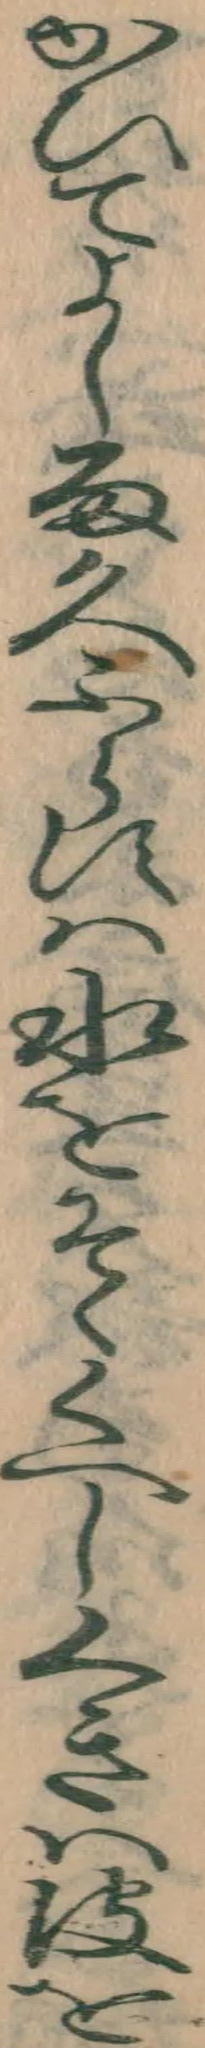かひてよし雨久ふらすは水をそゝくへしくきは皮を
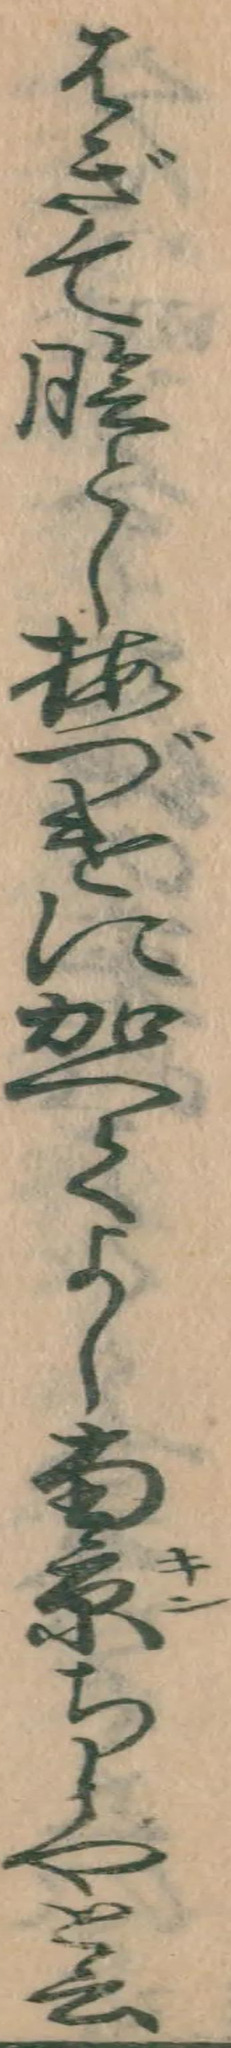はぎて膾とし梅づけに加へてよし南京ちしやと云
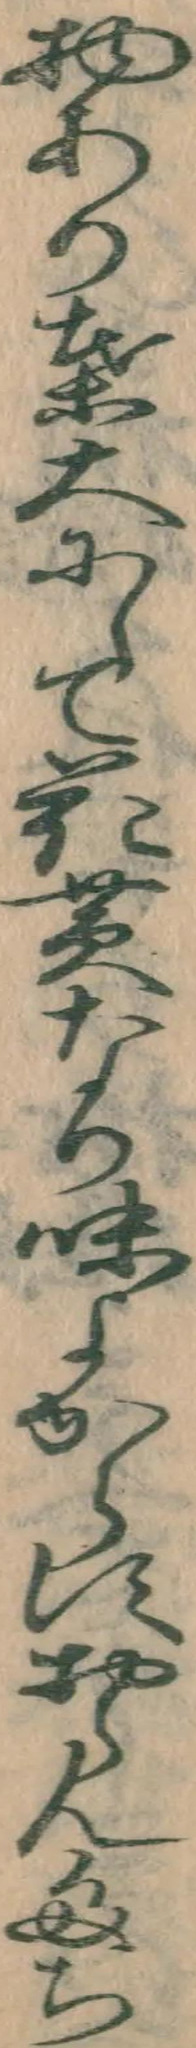物あり葉大にして花黄なり味よからすおらんたち
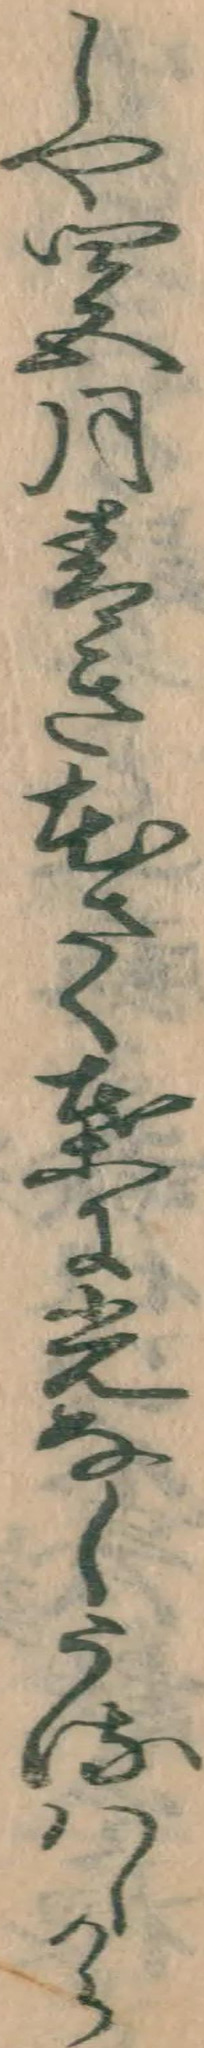しや四五月青き花さく葉に光なしうるはしから
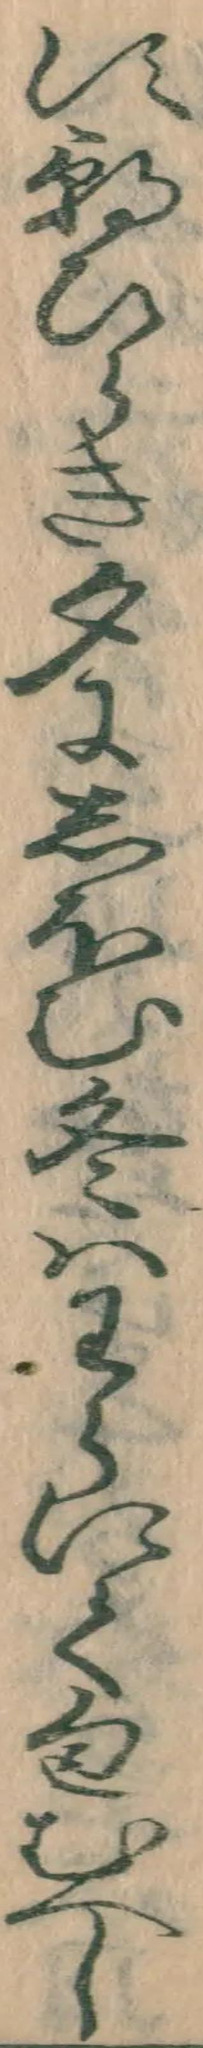す朝ひらき夕にしほむ冬はわらにて包むへし
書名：菜譜 3巻
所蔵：国立国会図書館 National Diet Library, JAPAN
